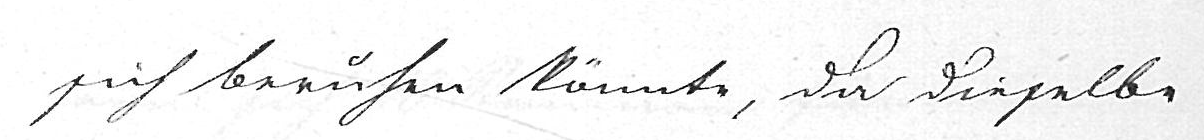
sich beruhen könnte, da dieselbe
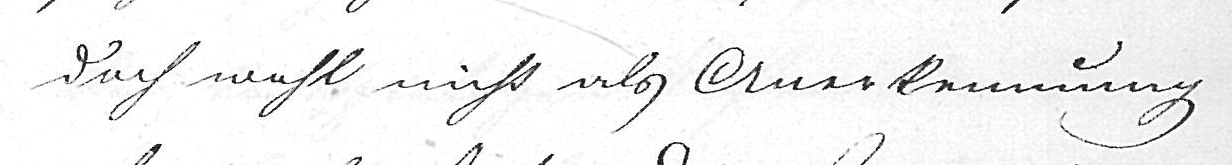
doch wohl nicht als Anerkennung
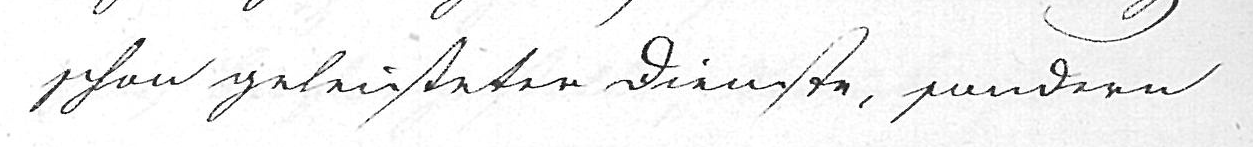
schon geleisteter Dienste, sondern
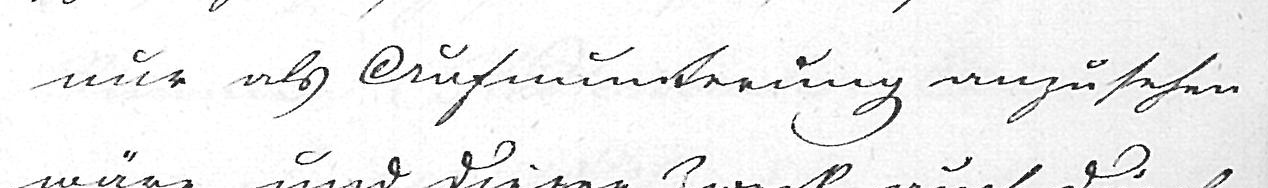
nur als Aufmunterung anzusehen
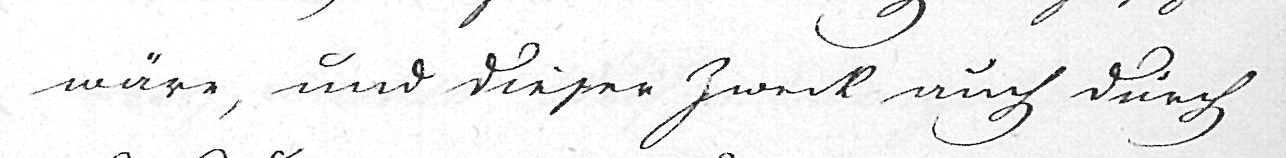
wäre, und dieser Zweck auch durch
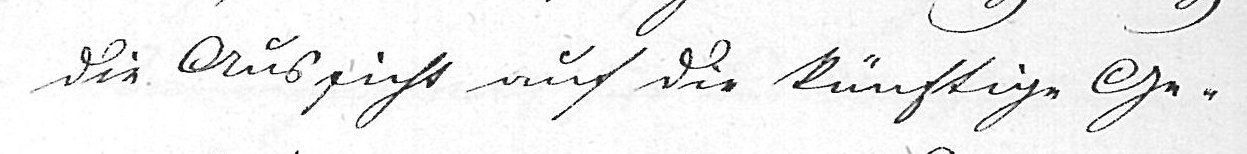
die Aussicht auf die künftige Ge-
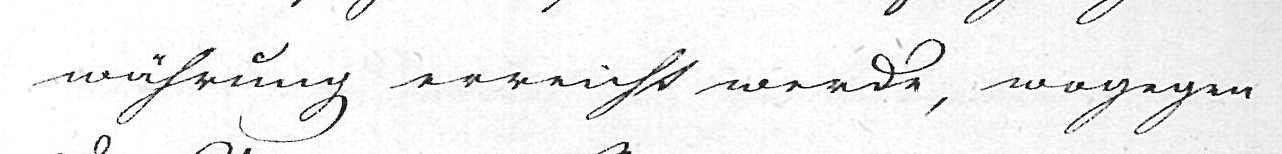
währung erreicht werde, wogegen
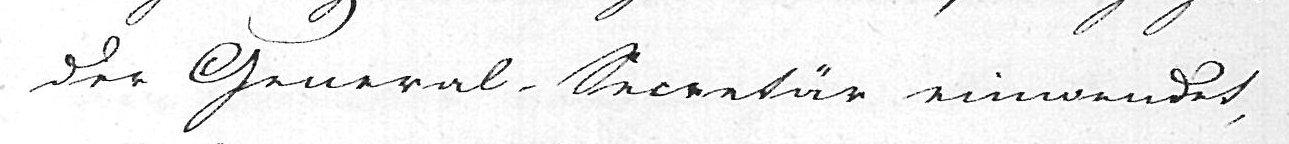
der General-Secretär einwendet,
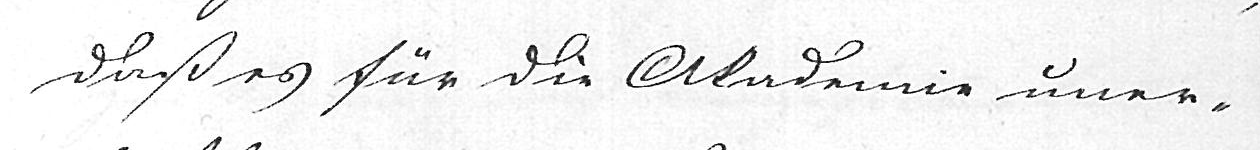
daß es für die Akademie uner-
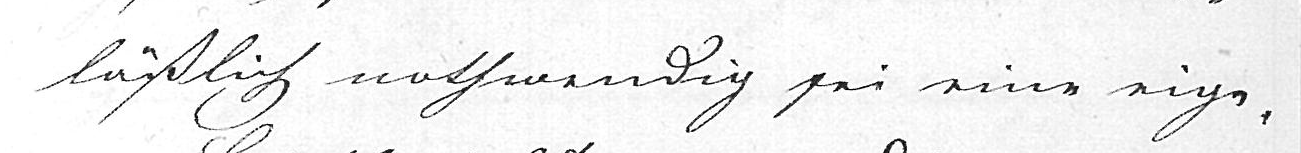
läßlich nothwendig sei eine eige-
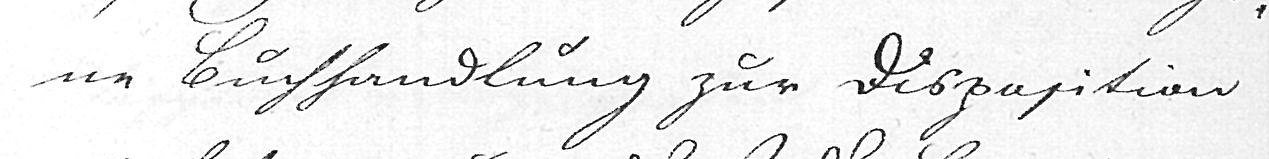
ne Buchhandlung zur Disposition
